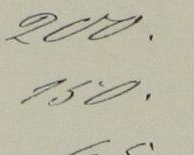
150
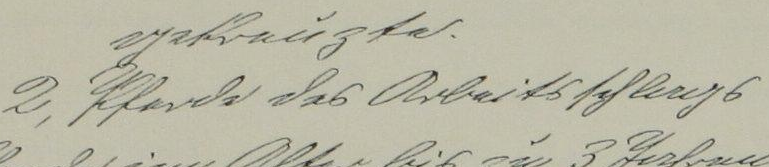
2. Pferde des Arbeitsschlages
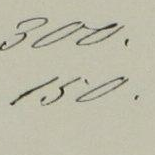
150
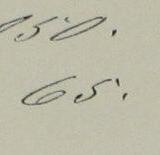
65
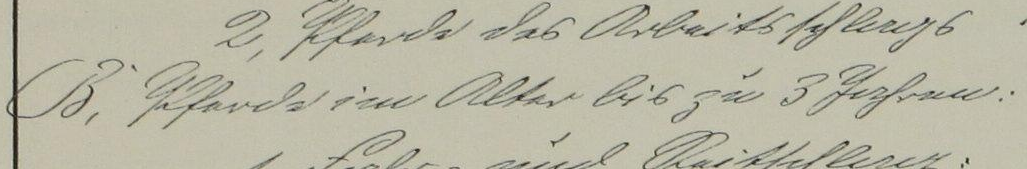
B. Pferde im Alter bis zu 3 Jahren:
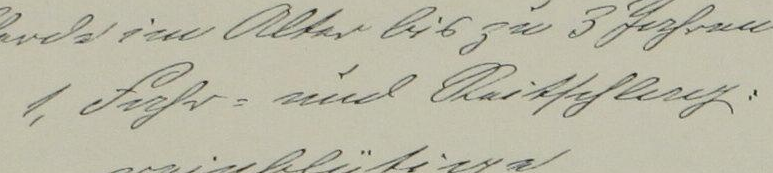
1. Fahr- und Reitschlag:
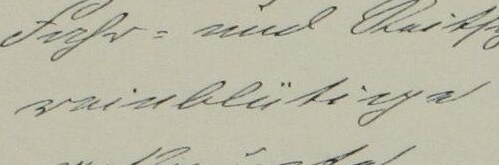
reinblütige
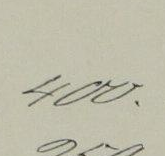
400
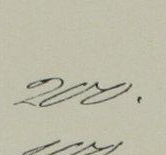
200
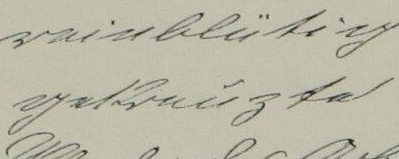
gekreuzte
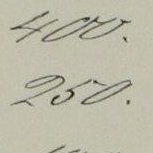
250
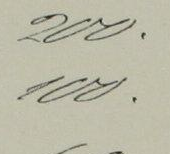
100
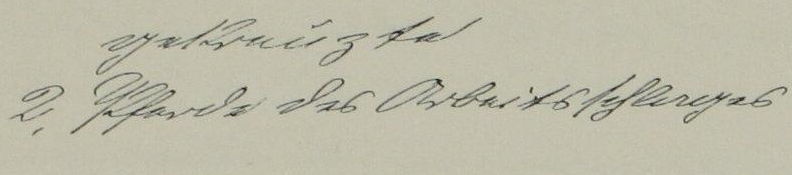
2. Pferde des Arbeitsschlages
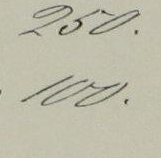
100
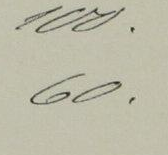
60
